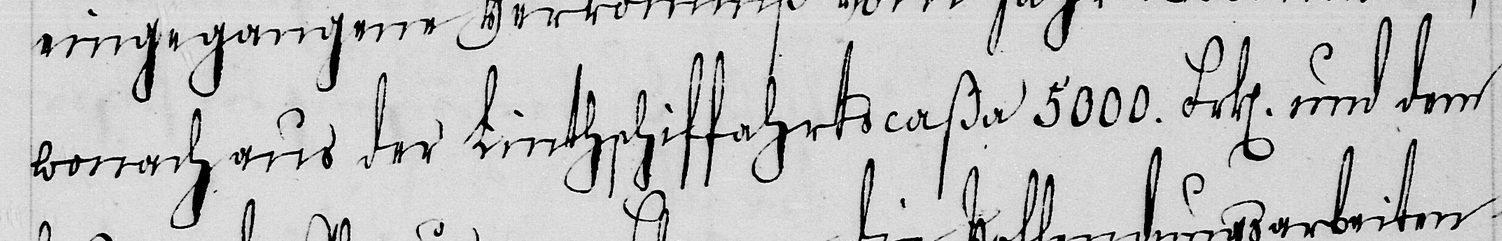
wonach aus der Linthschiffahrtscaßa 5000. Frk[en]. und
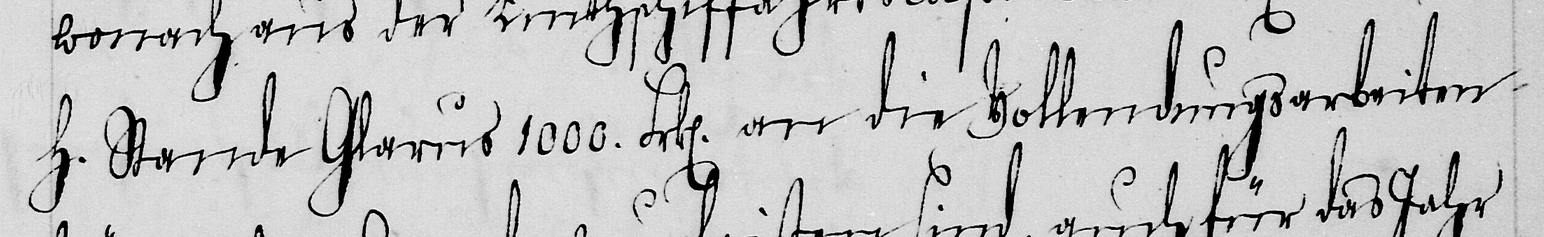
H. Stande Glarus 1000. Frk[en]. an die Vollendungsarbeiten
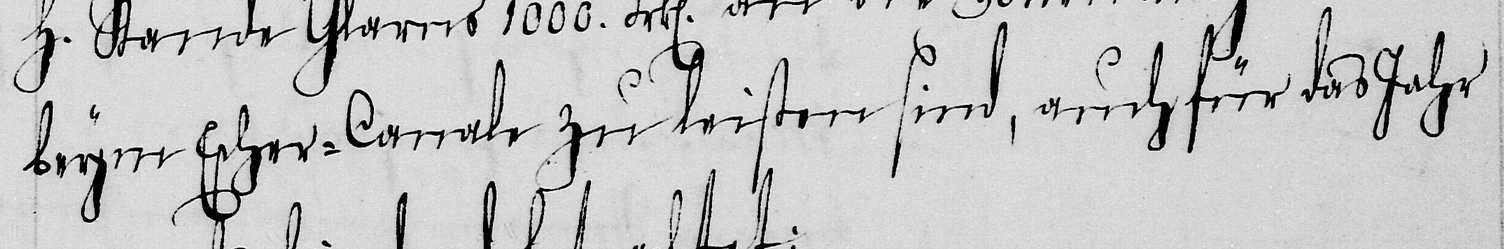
beym Escher-Canale zu leisten sind, auch für das Jahr
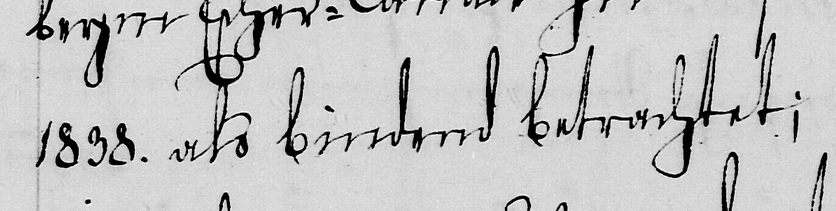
1838. als bindend betrachtet;
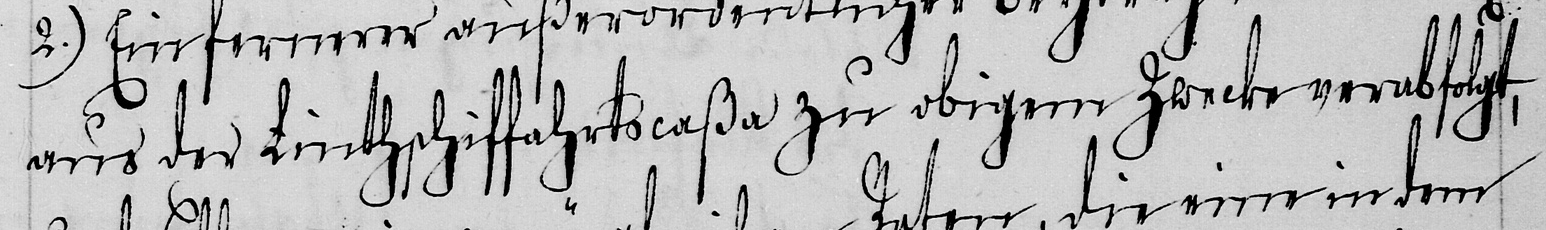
aus der Linthschiffahrtscaßa zu obigem Zwecke verabfolgt,
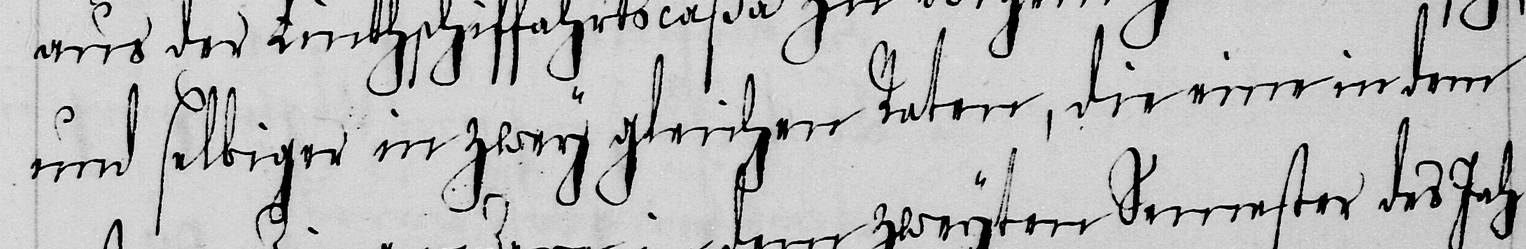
und selbiger in zwey gleichen Raten, die eine in dem
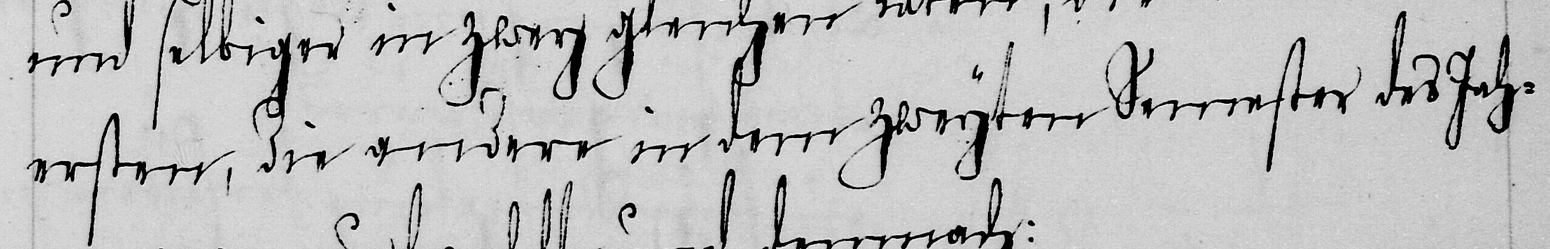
ersten, die andere in dem zweyten Semester des Jah¬
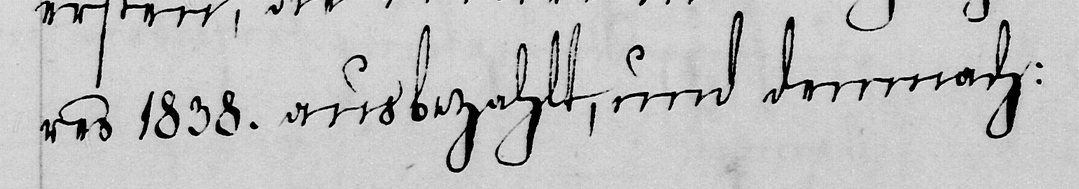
res 1838. ausbezahlt, und demnach:
